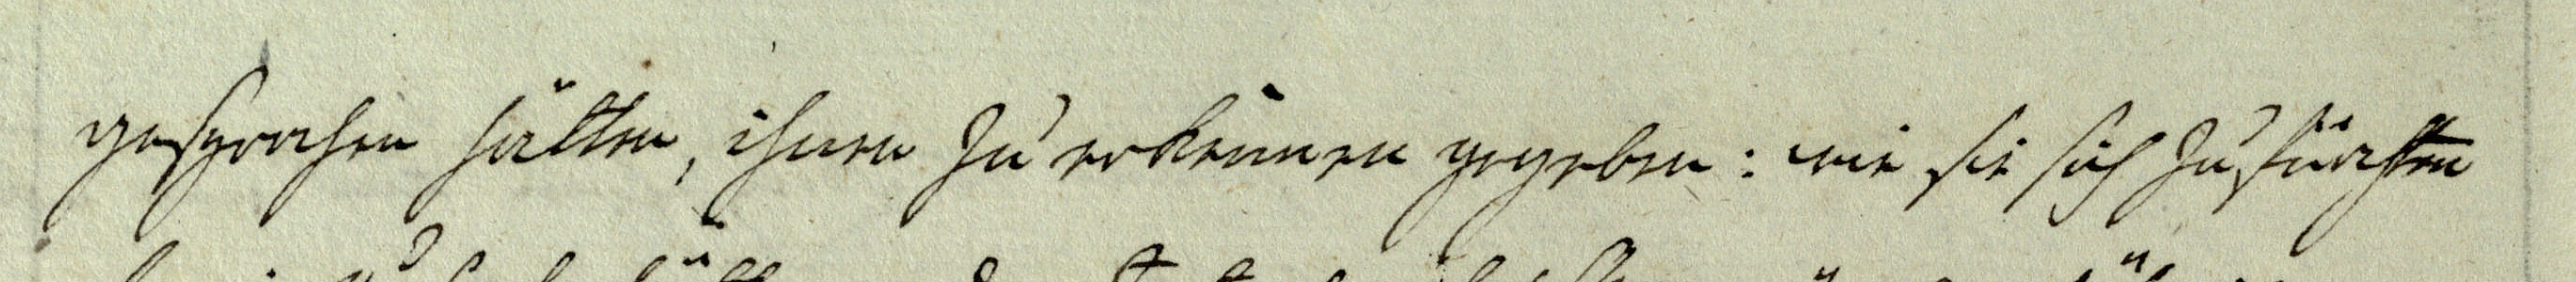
gesprochen hätten, ihnen zu erkennen gegeben: wie sie sich zufürchten
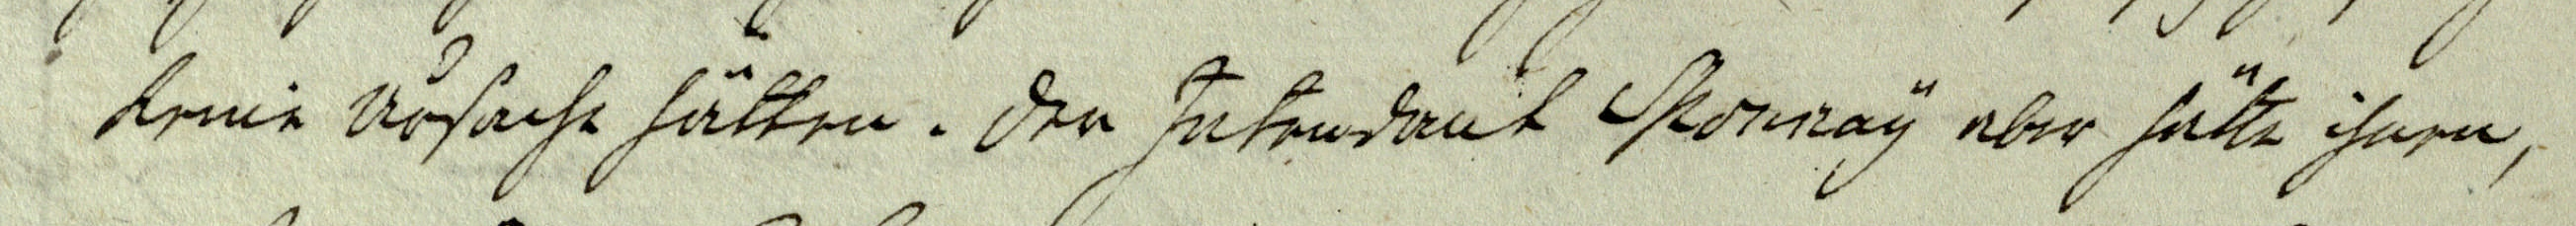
keine Ursache hätten. Der Intendant Monnaÿ aber hätte ihnen,
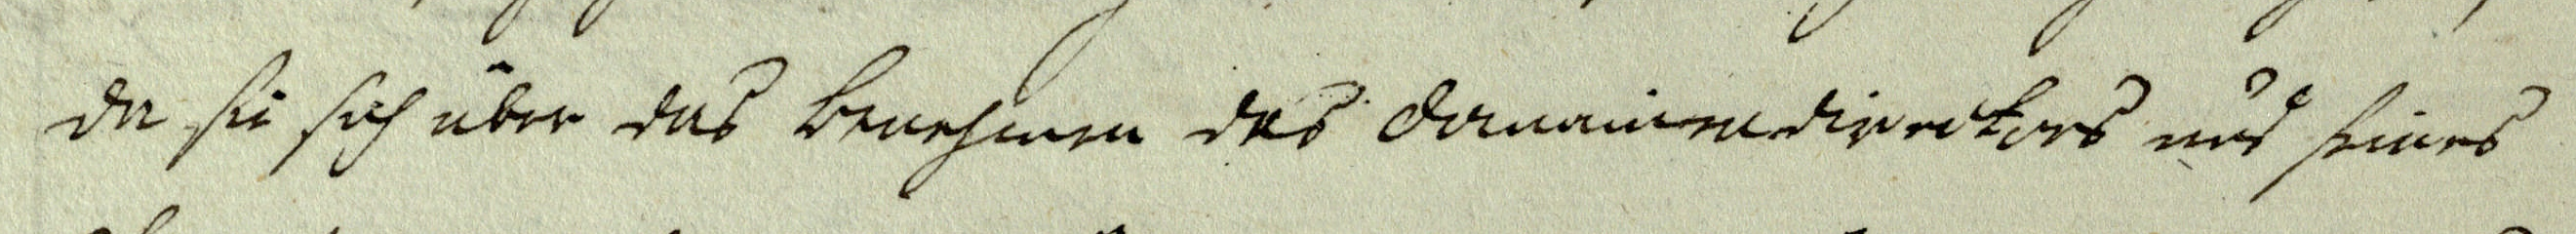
da sie sich über das Benehmen des Domainendirectors und seines
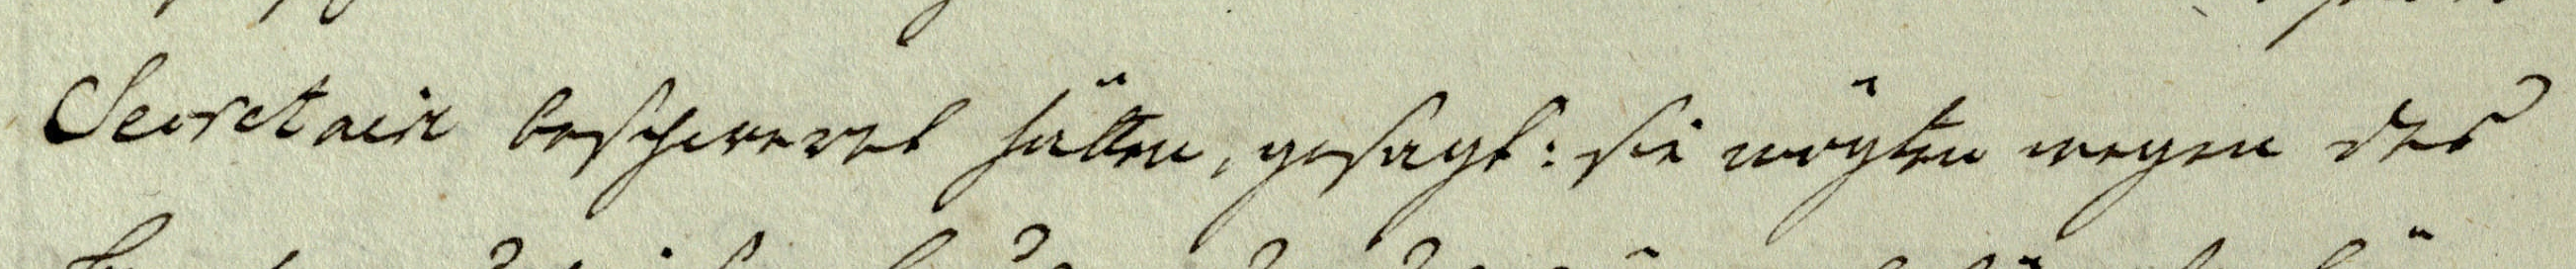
Secretaire beschweret hätten, gesagt: sie mögten wegen des
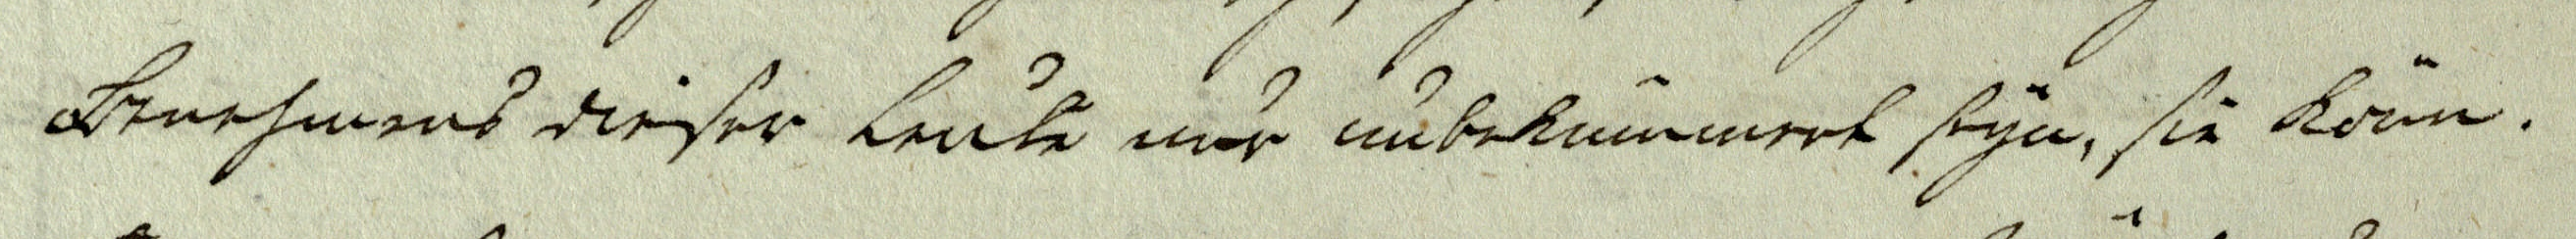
Benehmens dieser Leute nur unbekümmert seÿn, sie könn¬
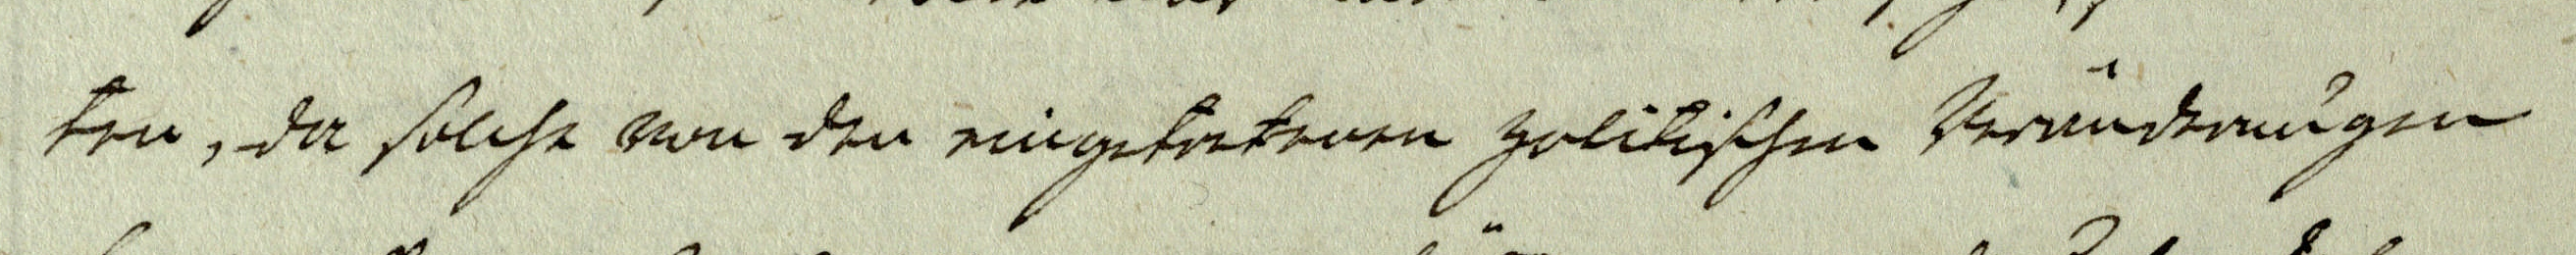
ten, da solche von den eingetretenen politischen Veränderungen
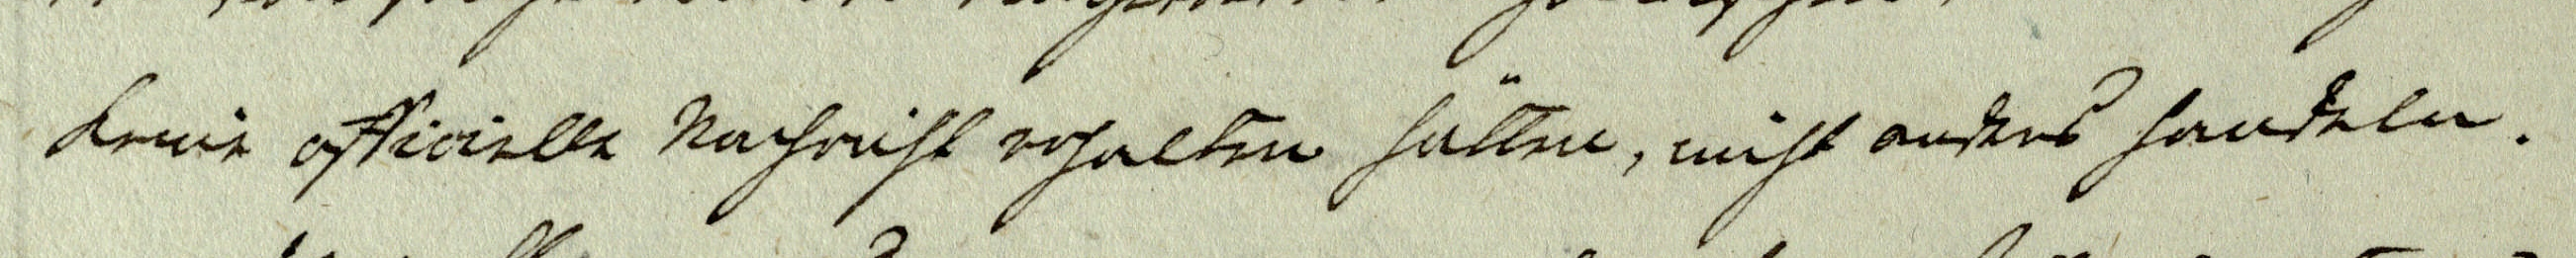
keine officielle Nachricht erhalten hätten, nicht anders handeln.
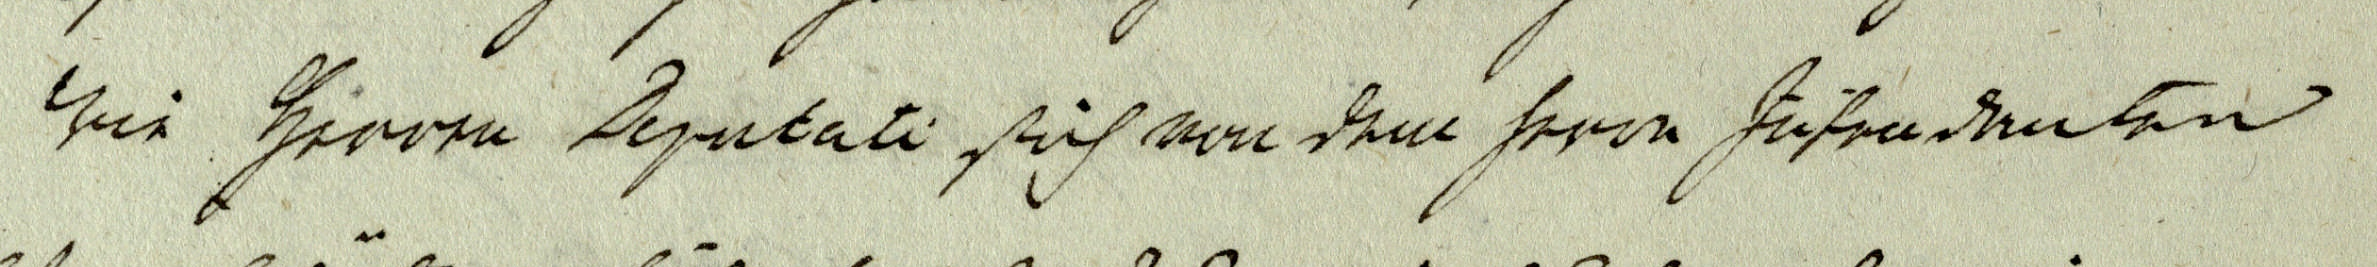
Wie Herren Deputati sich von dem Herrn Intendanten
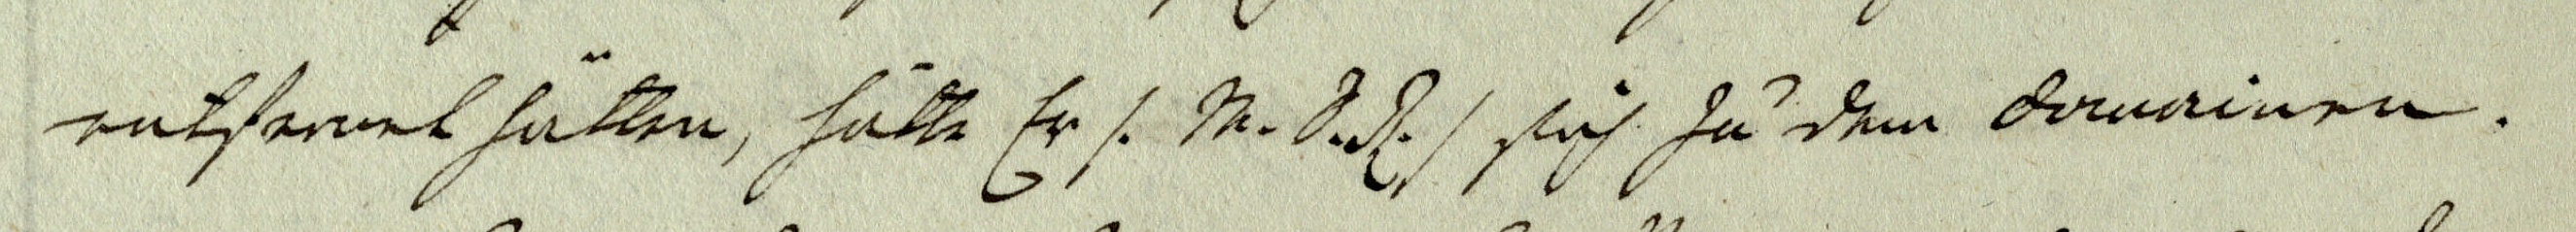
entfernet hätten, hätte Er /. M. D. R./ sich zu dem Domainen¬
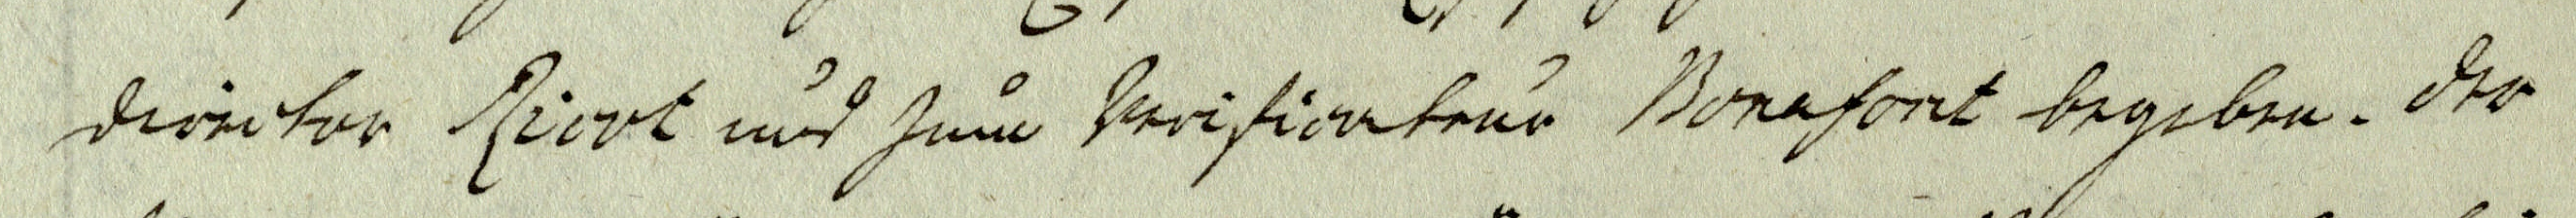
director Ricot und zum Verificateur Bonafont begeben. der
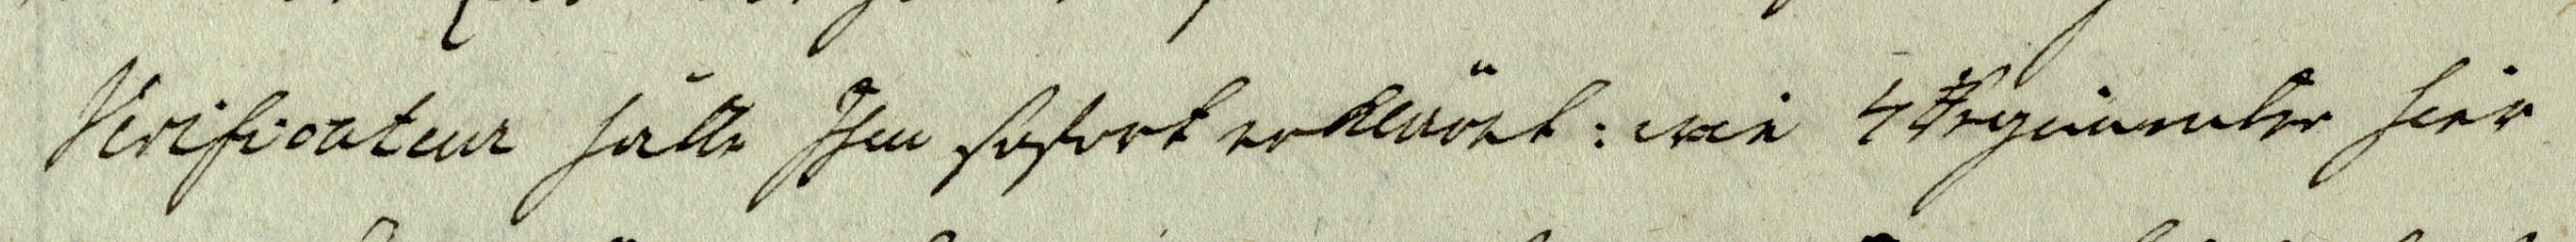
Verificateur hätte Ihm sofort erkläret: wie 4 Regimenter hier
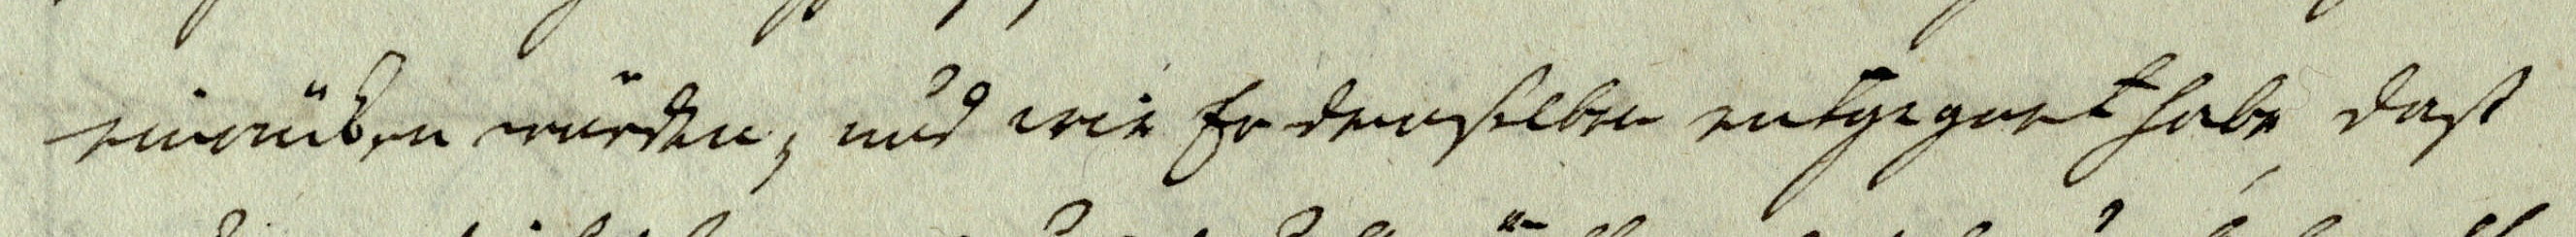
einrücken würden, und wie Er demselben entgegnet habe, daß
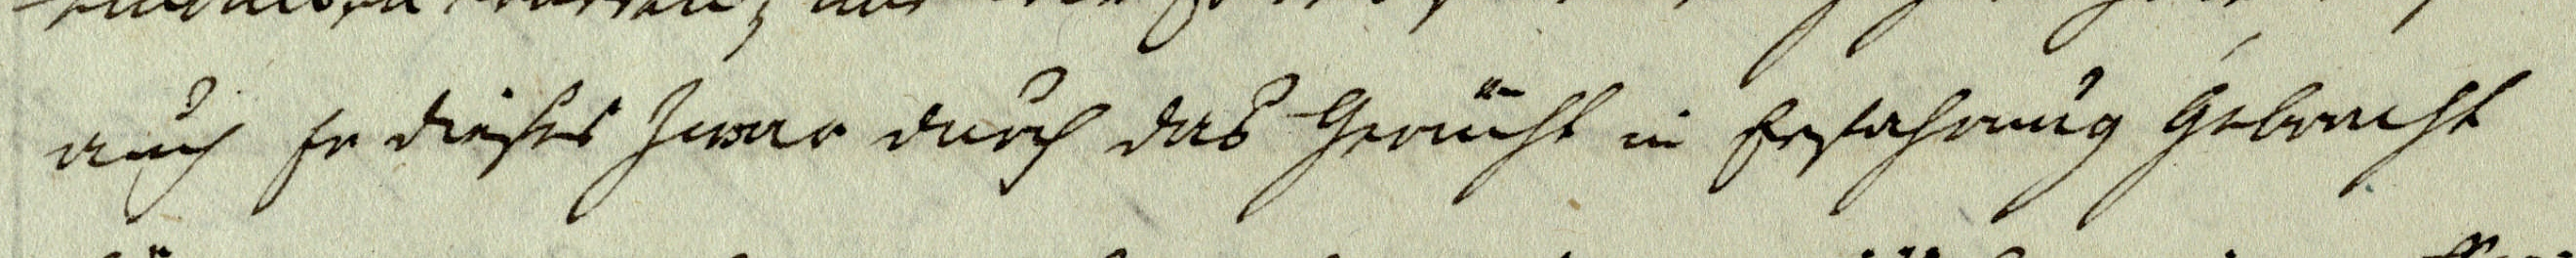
auch Er dieses zwar durch das Gerücht in Erfahrung gebracht
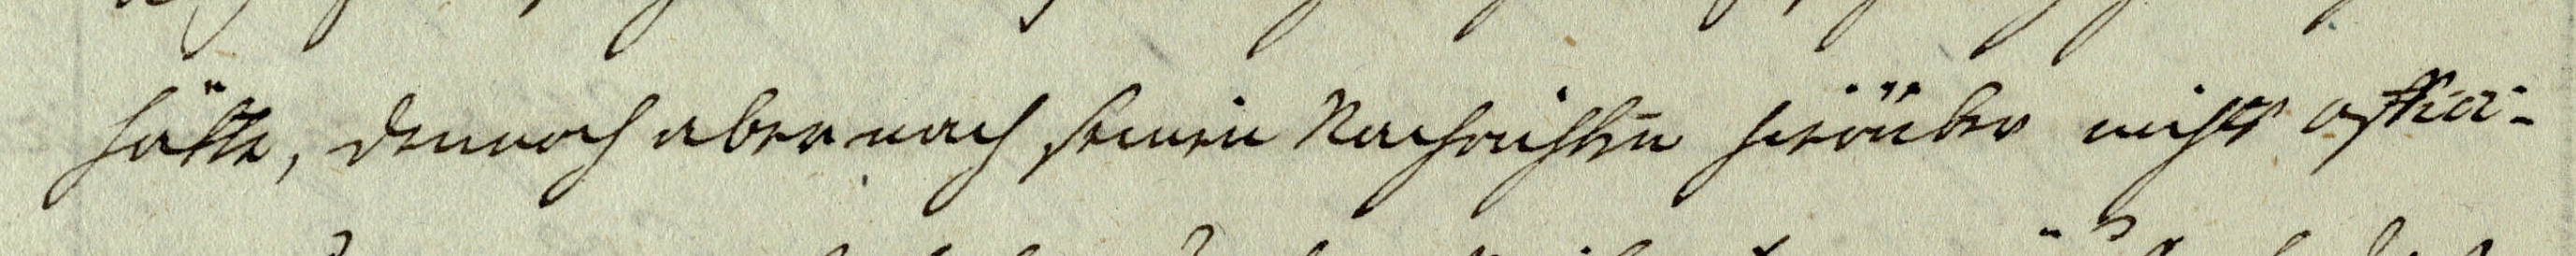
hätte, dennoch aber nach seinen Nachrichten hierüber nichts offici¬
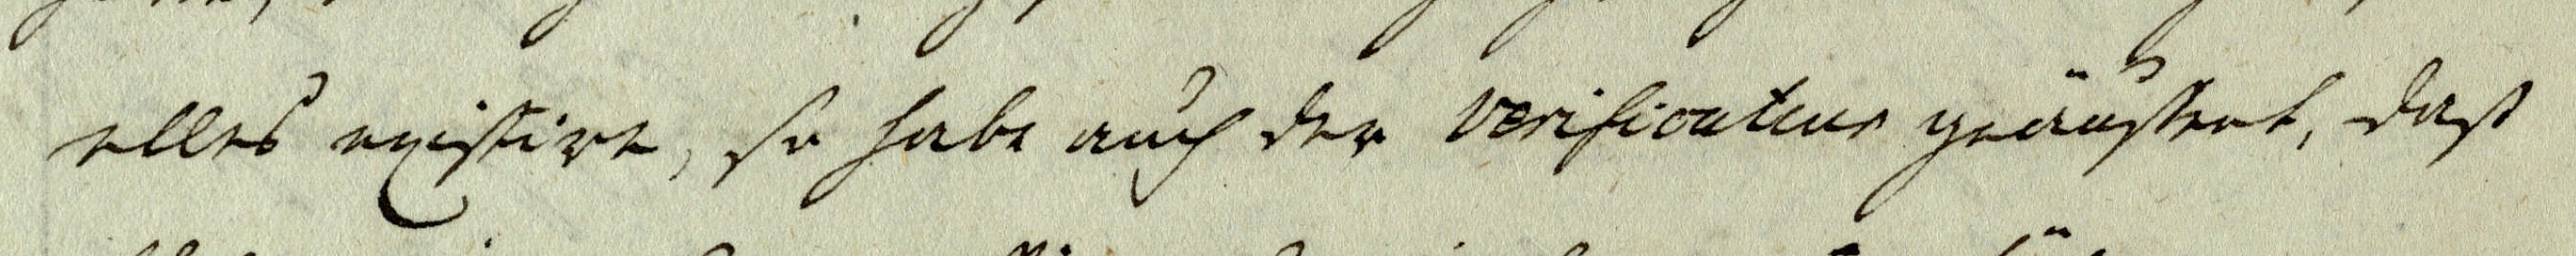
elles existire, so habe auch der Verificateur geäussert, daß
